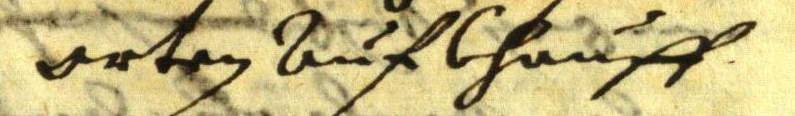Orten Aūfkhaūff.
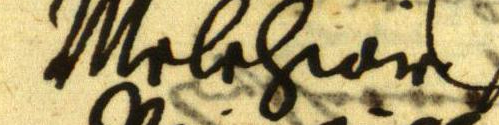Melchior
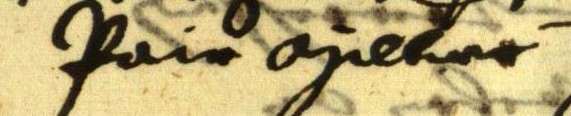Pair Miller
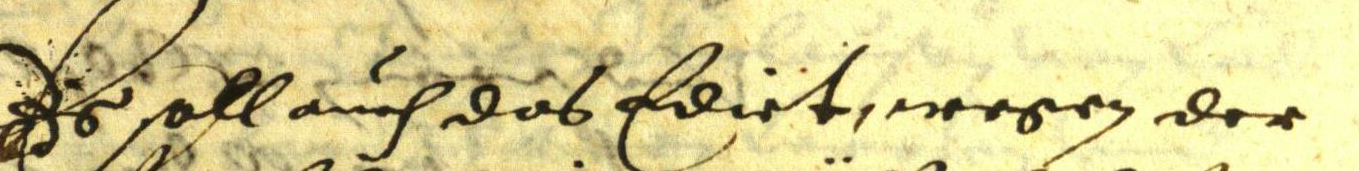Es soll aūch das Edict, wegen der
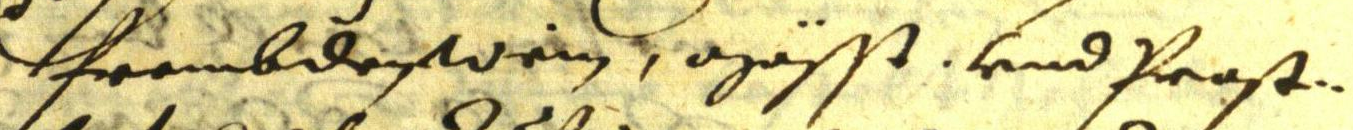frembden Wein, Mösst. vnd Prost¬
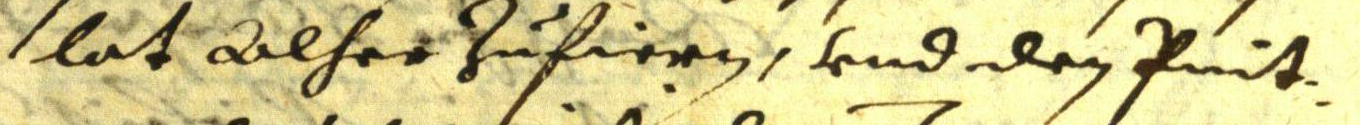lat Alher Zūfiern, vnd den Pint¬
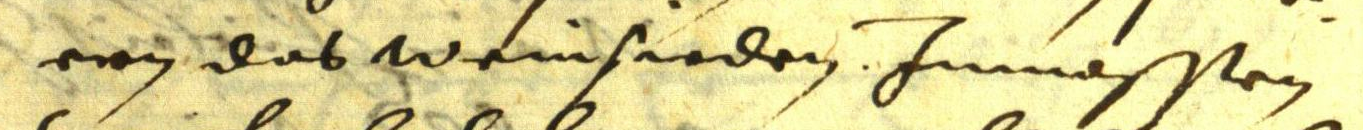ern das Weinsieden. Inmassen
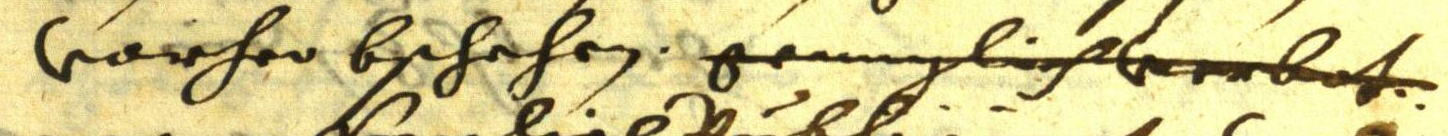vorher bschehen. gennzlich verbot¬
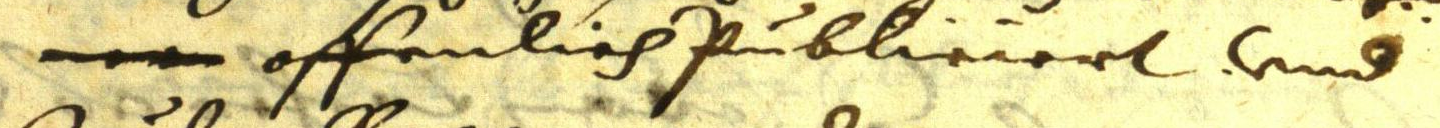nern offenlich Pūbliciert. vnd
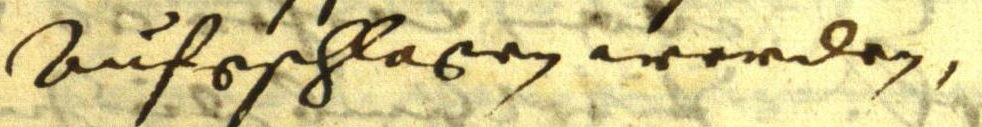Aūfgschlagen werden,
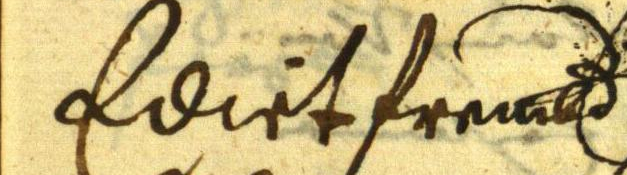Edict frembd
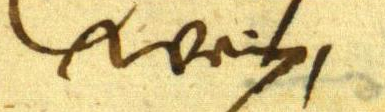Wein,
